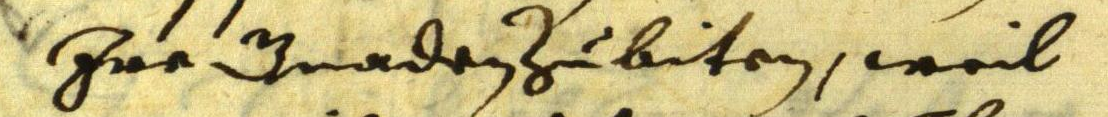Ire Gnaden Zū biten, weil
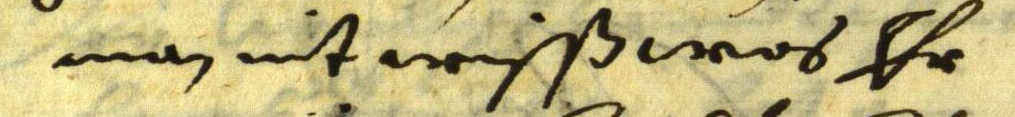man nit wisß was Er
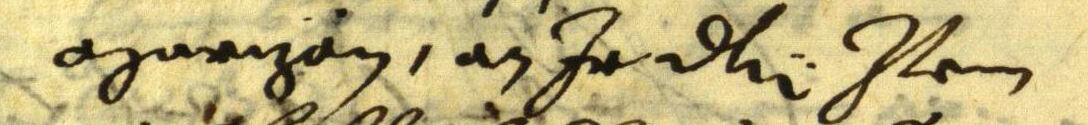Marzän, an Ir dt: Item
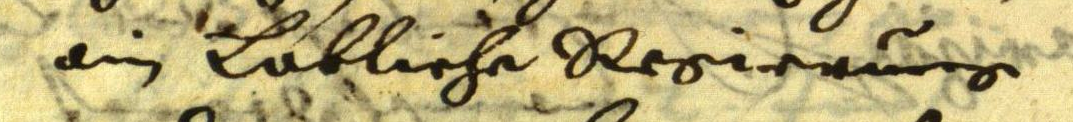ain Lobliche Regierūng
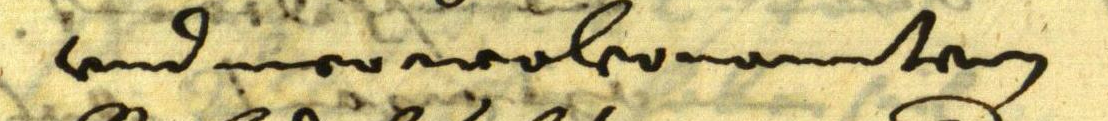vnd mer wolernannten
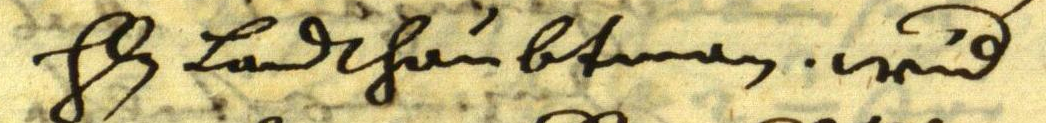hln Landthaūbtman. wid
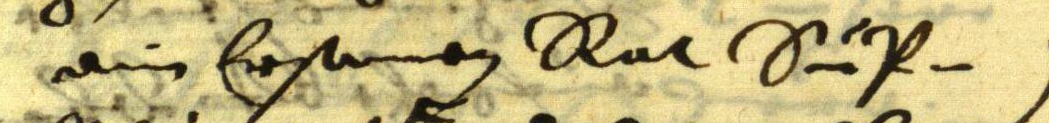ain Ersamen Rat SūP¬
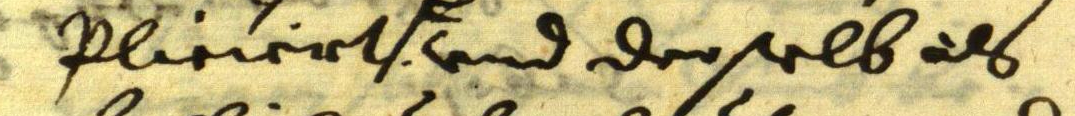Pliciert. vnd derselb als
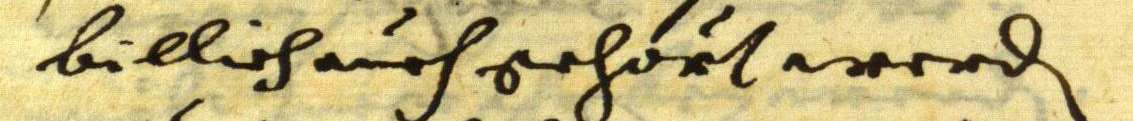billich aūch gehōrt werd
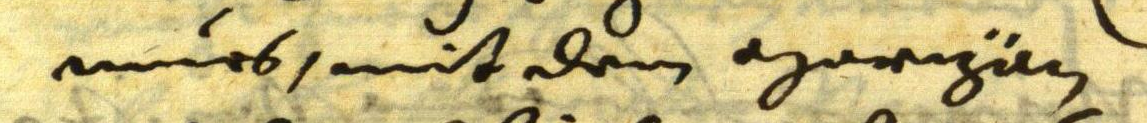mūes, mit dem Marzän
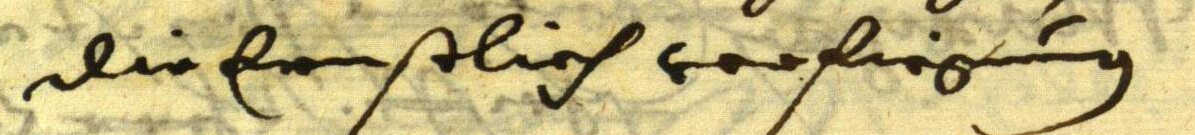die Ernstlich verfiegūng
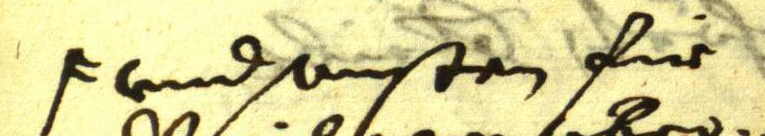vnd sonsten fir
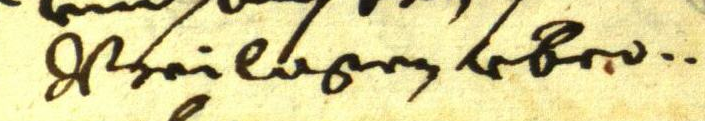Beilagen v̄ber¬
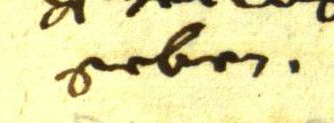geben.
